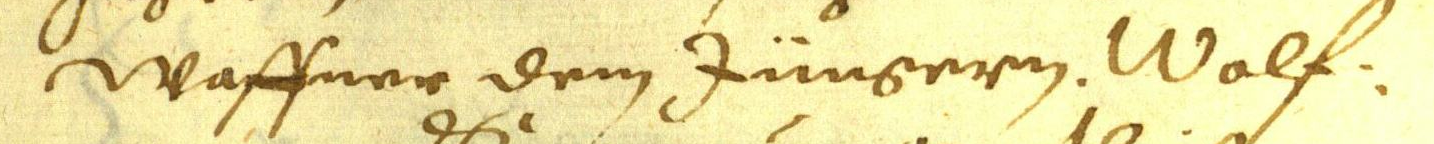Waffner dem Jüngern. Wolf¬
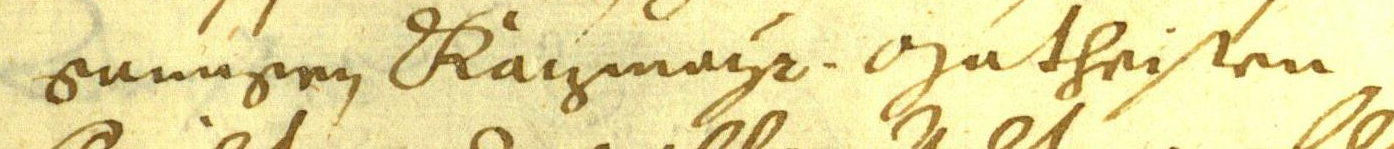gangen Kazmaȳr. Matheisen
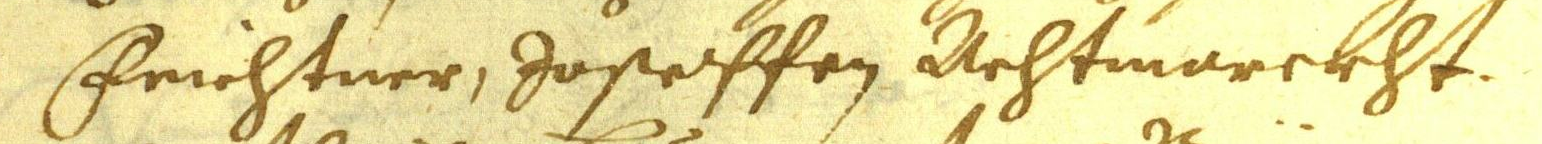Feichtner, Joseffen Achtmarckht.
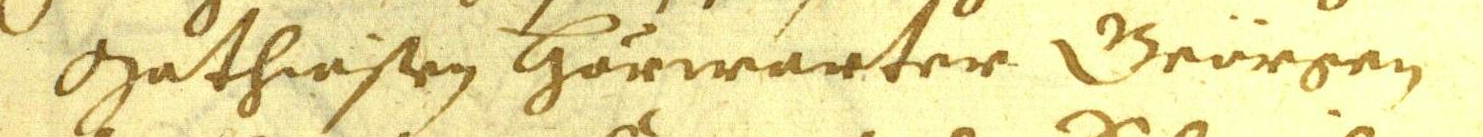Matheisen Hōrwarter Geörgen
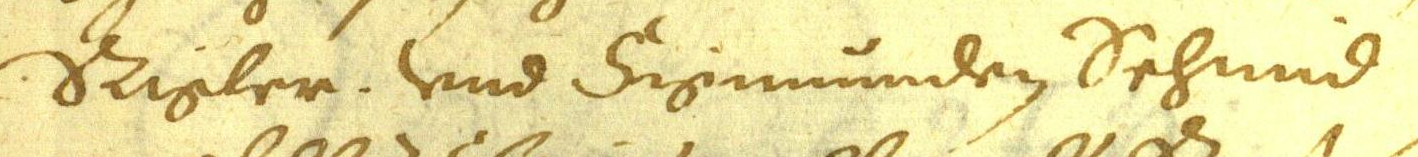Rigler. vnd Sigmūnden Schmid
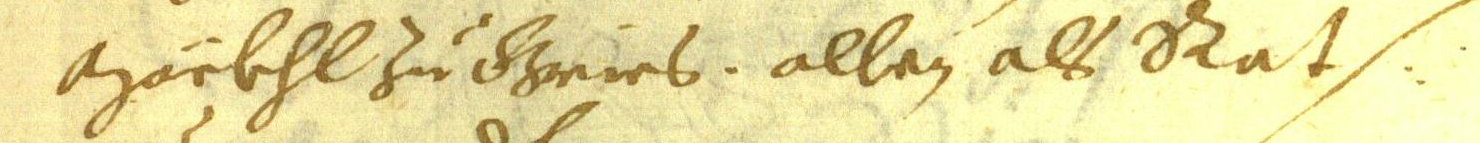Mäckhl Zū Gries. allen als Rats¬
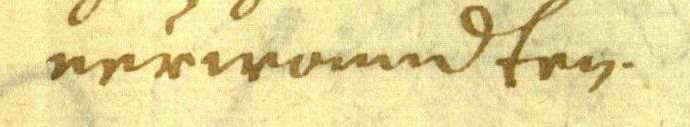vērwanndten.
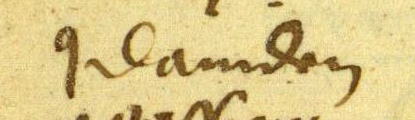Daūiden
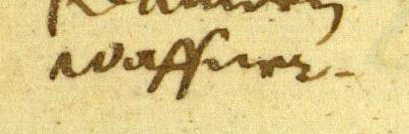Waffner.
